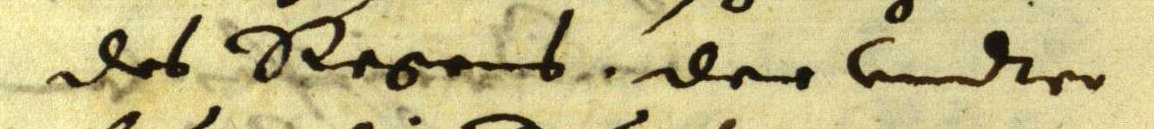des Regens. der vndter
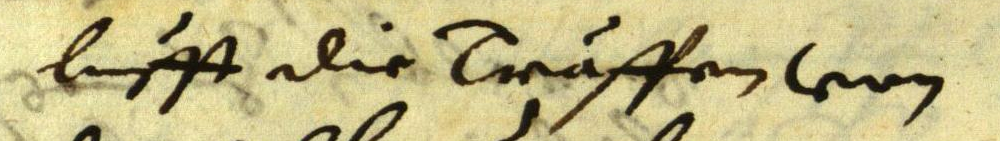leūfft die Trāffen von
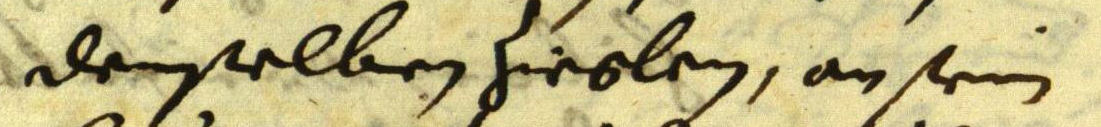denselben Zieglen, an sein
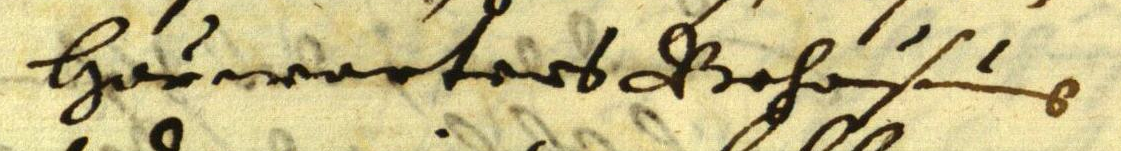Hōrwarters Behaūsūng
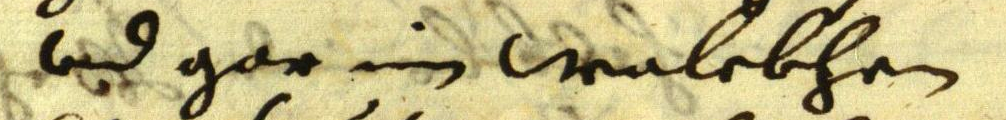vnd gar im Walckhen
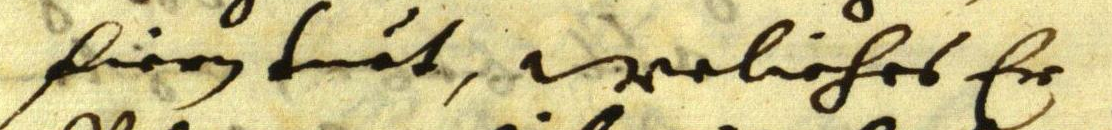fiern tuēt, weliches Er
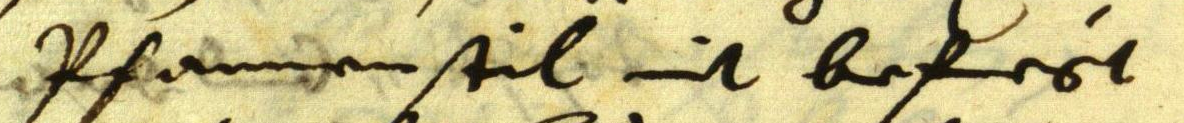Pfannenstil nit befiegt
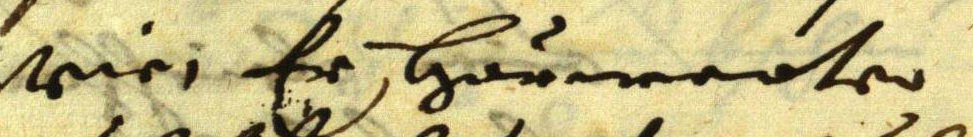seie, Er Hōrwarter
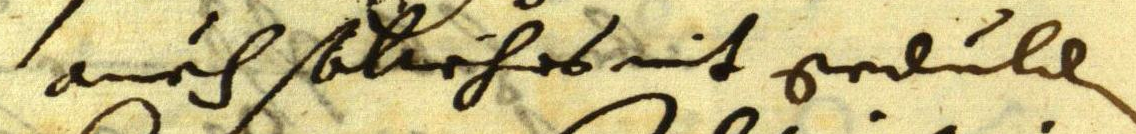aūch soliches nit gedūld
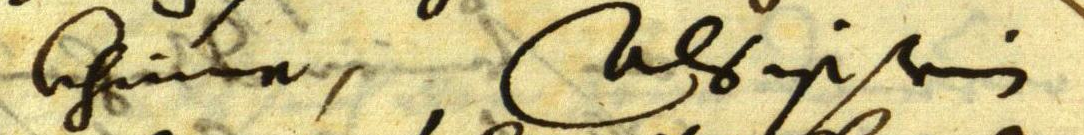khinne, Als ist sein
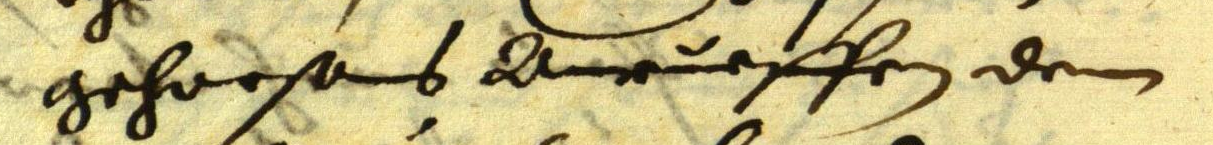gehorsams Anrūeffen dem
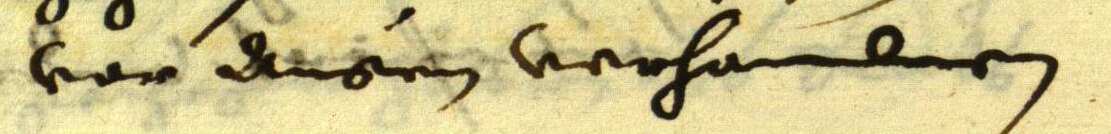vor Aūgen verhanndnen
